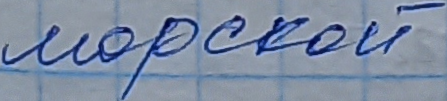морской
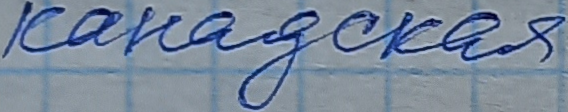канадская
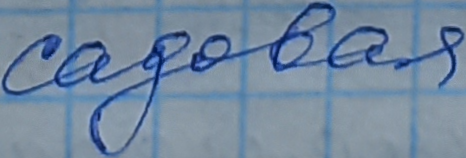садовая
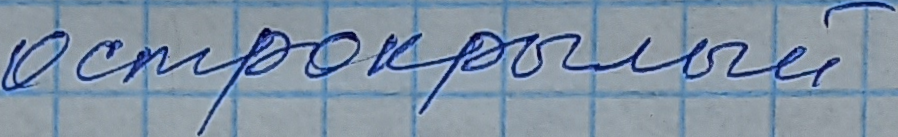острокрылый
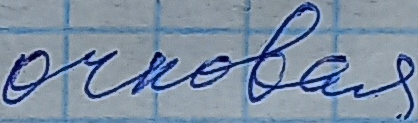очковая
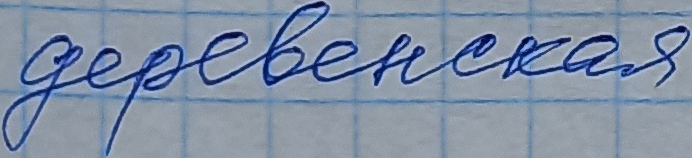деревенская
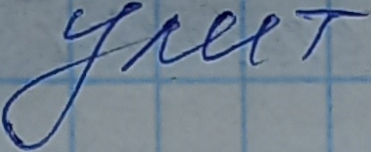улит
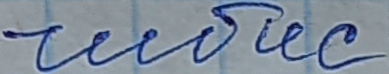чибис
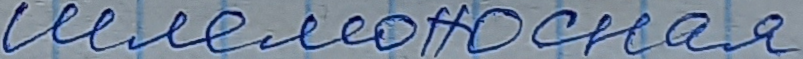шлемоносная
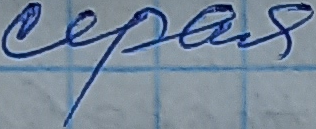серая
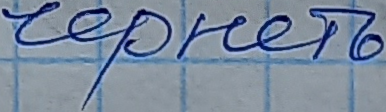чернеть
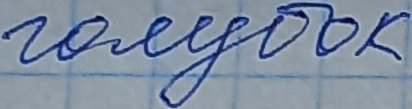голубок
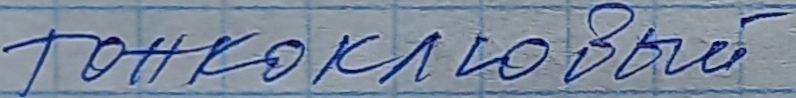тонкоклювый
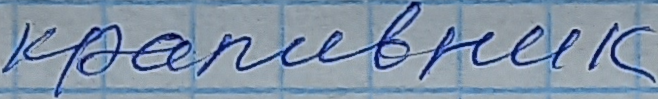крапивник
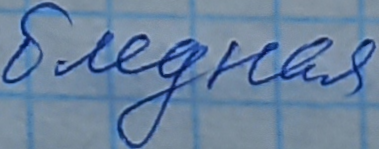бледная
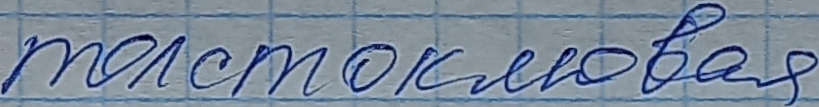толстоклювая
